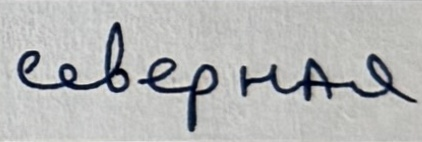северная
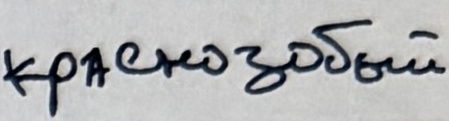краснозобый
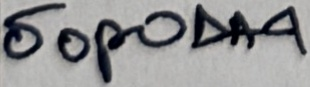бородач
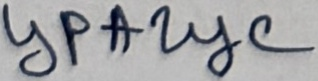урагус
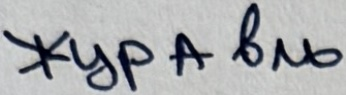журавль
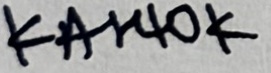канюк
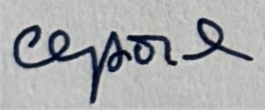серая
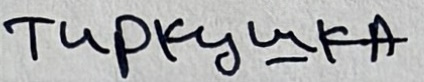тиркушка
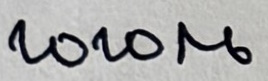гоголь
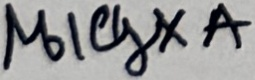лысуха
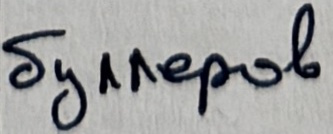буллеров
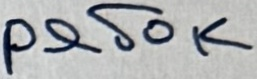рябок
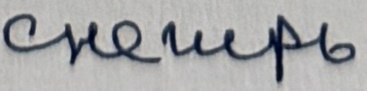снегирь
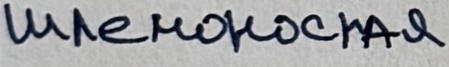шлемоносная
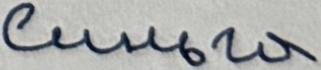синьга
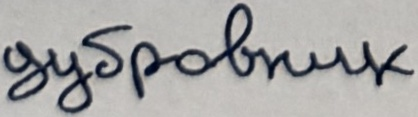дубровник
